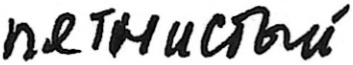пятнистый
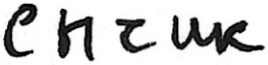сычик
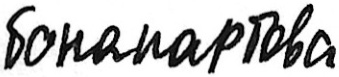бонапартова
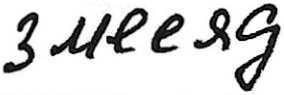змееяд
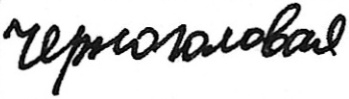черноголовая
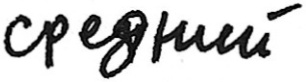средний
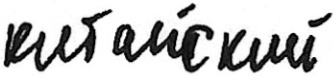китайский
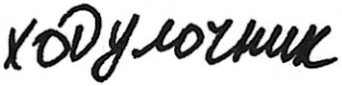ходулочник
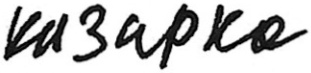казарка
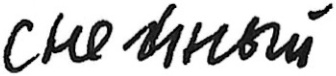снежный
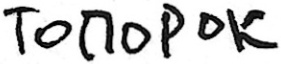топорок
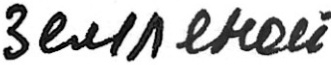земленой
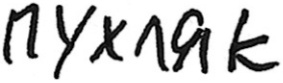пухляк
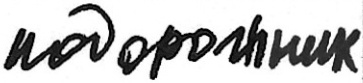подорожник
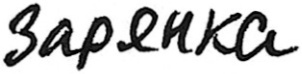зарянка
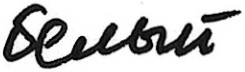белый
